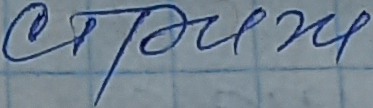стриж
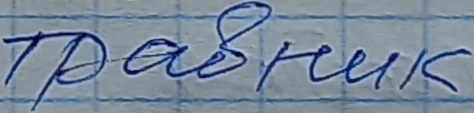травник
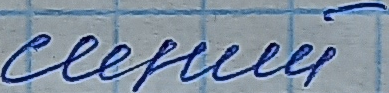синий
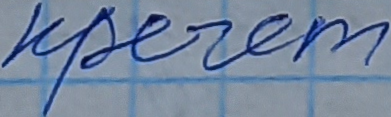кречет
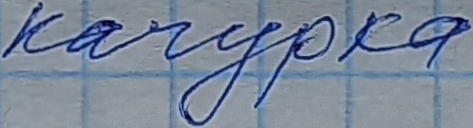качурка
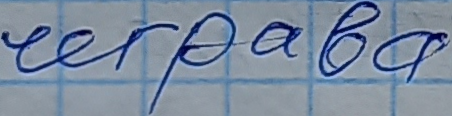чеграва
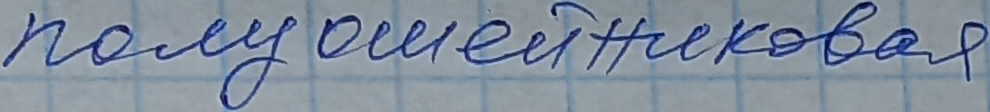полуошейниковая
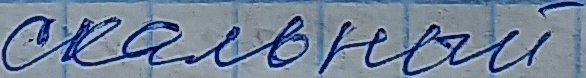скальный
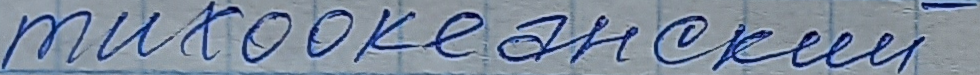тихоокеанский
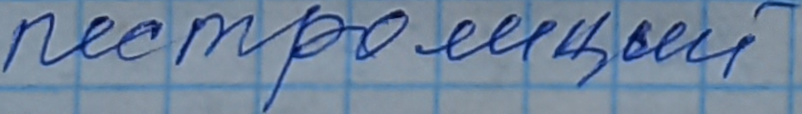пестролицый
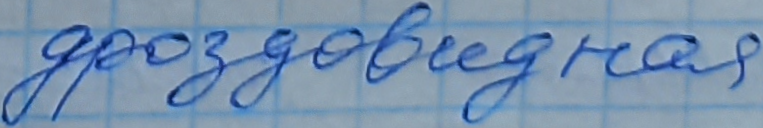дроздовидная
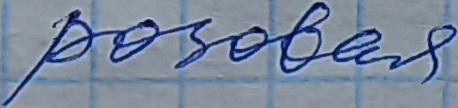розовая
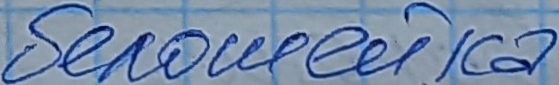белошейка
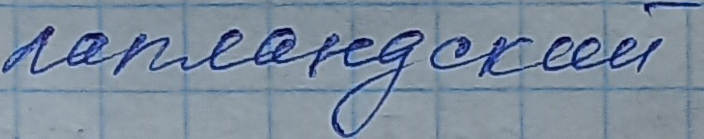лапландский
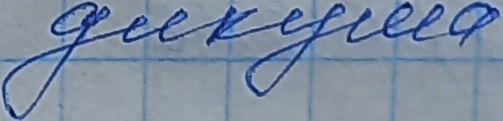дикуша
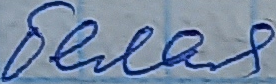белая
